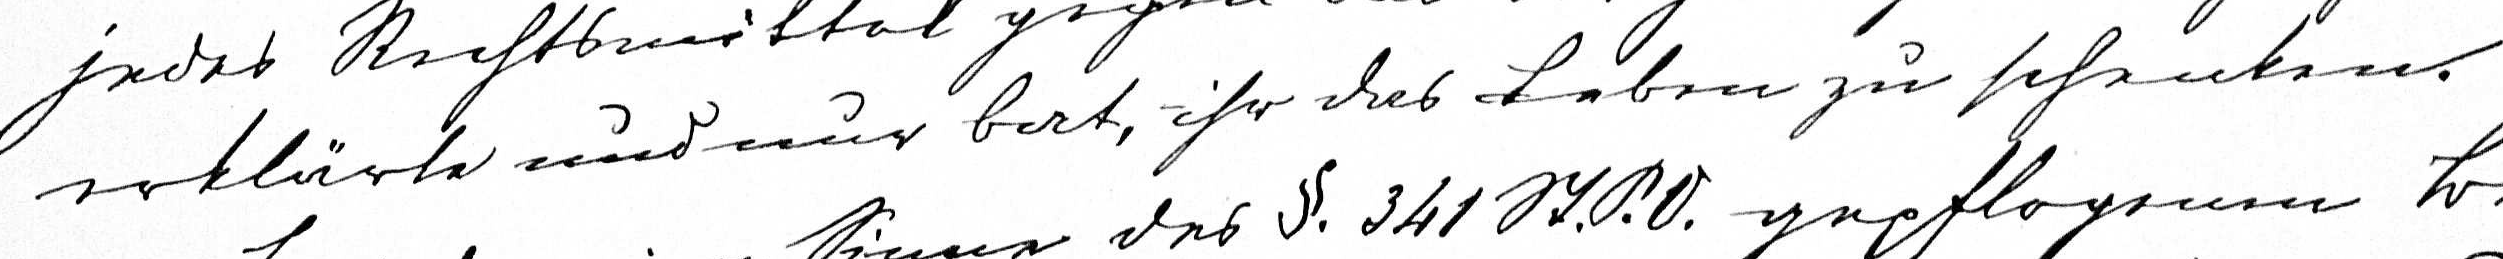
erklärte und nur bat, ihr das Leben zu schenken.
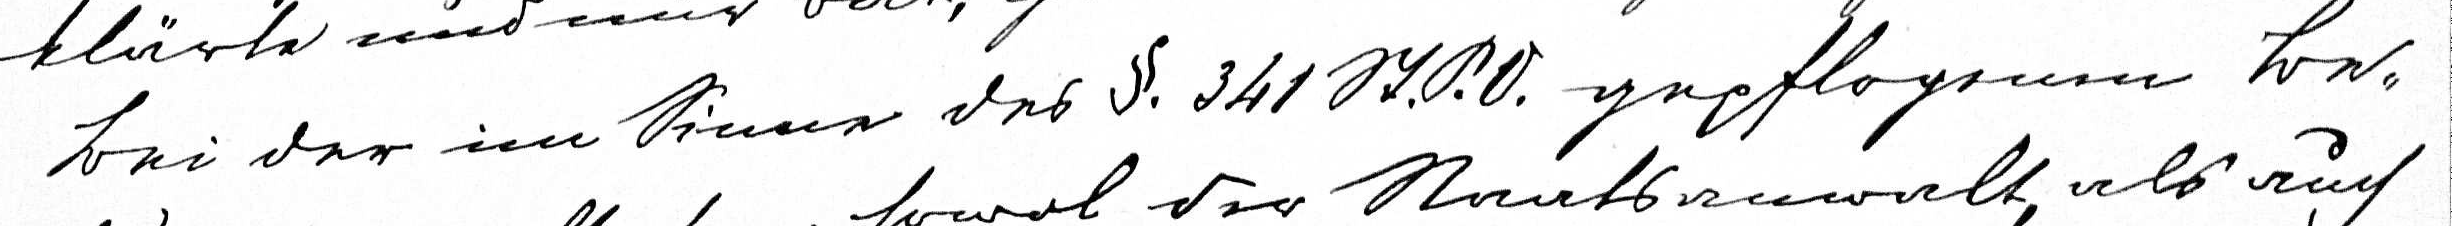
Bei der im Sinne des §341 St P O gepflogenen Be¬
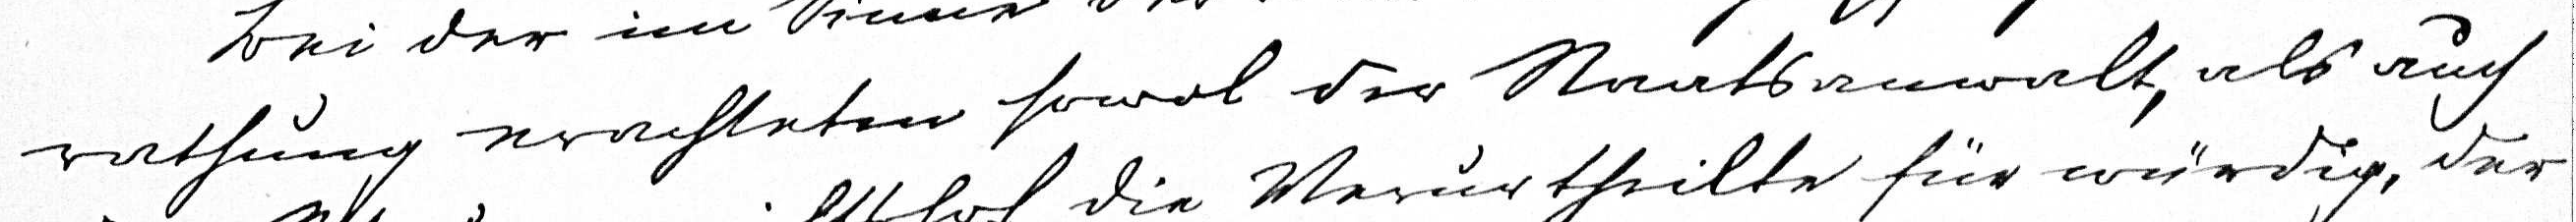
rathung erachteten sowol der Staatsanwalt, als auch
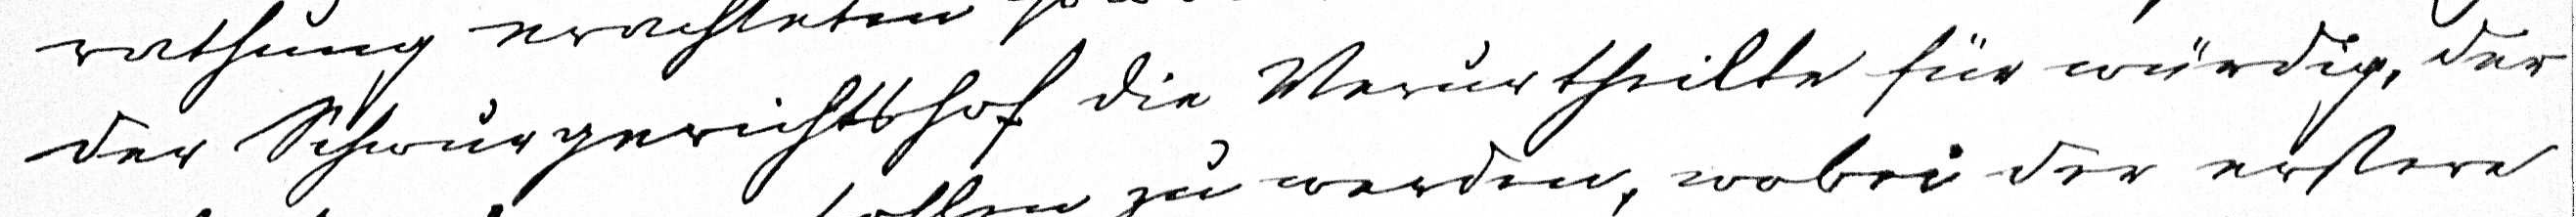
der Schwurgerichtshof die Verurtheilte für würdig, der
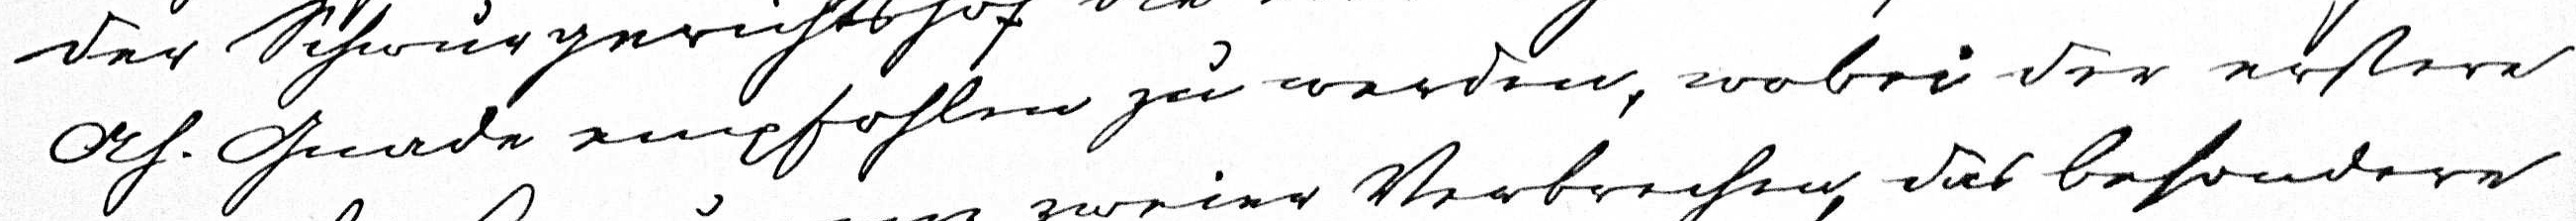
Ah. Gnade empfohlen zu werden, wobei der erstere
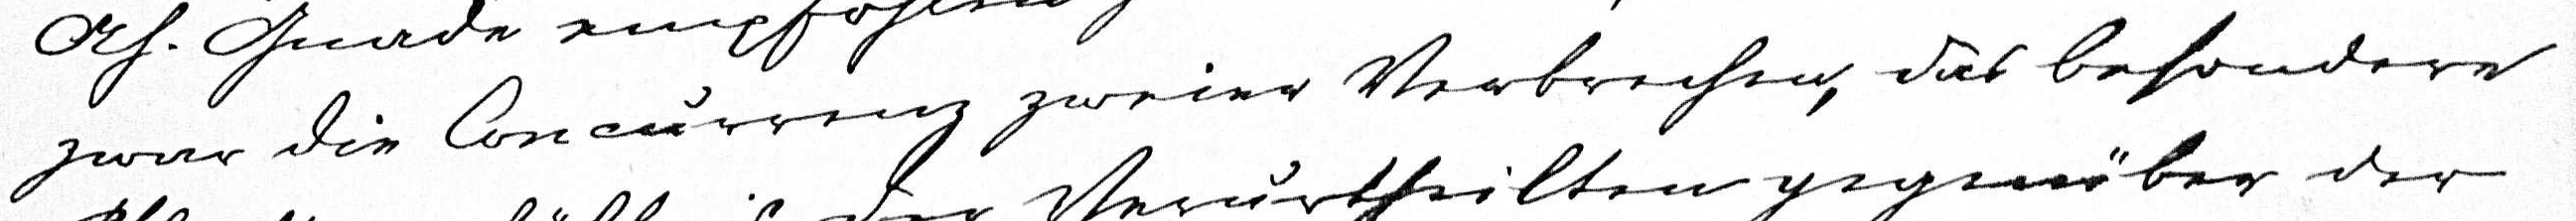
zwar die Concurrenz zweier Verbrechen, das besondere
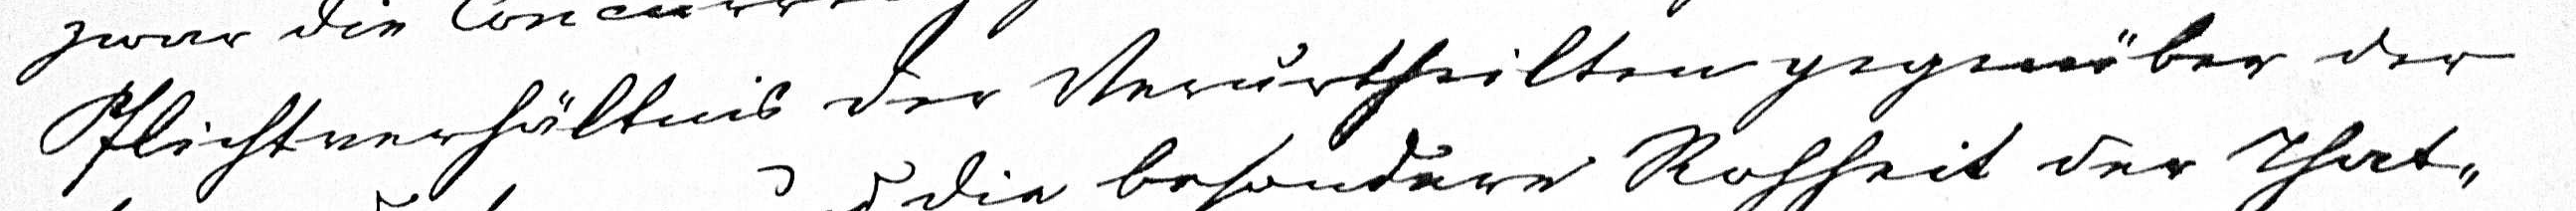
Pflichtverhältnis der Verurtheilten gegenüber der
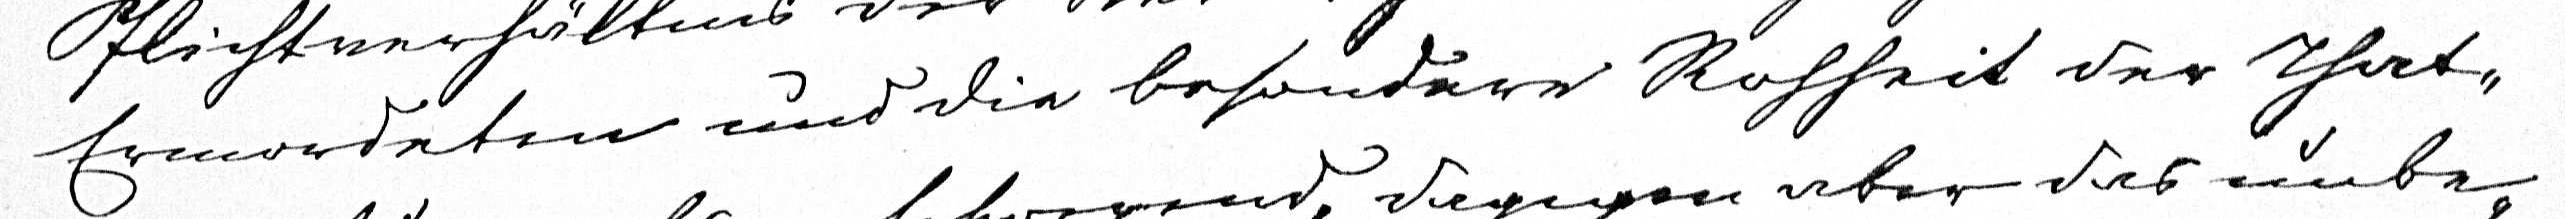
Ermordeten und die besondere Rohheit der That¬
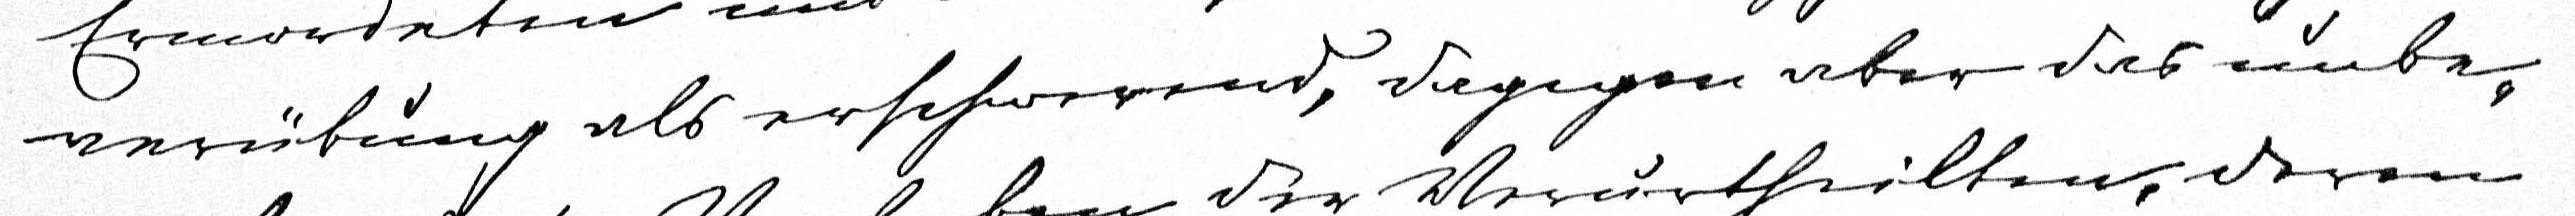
verübung als erschwerend, dagegen aber das unbe¬
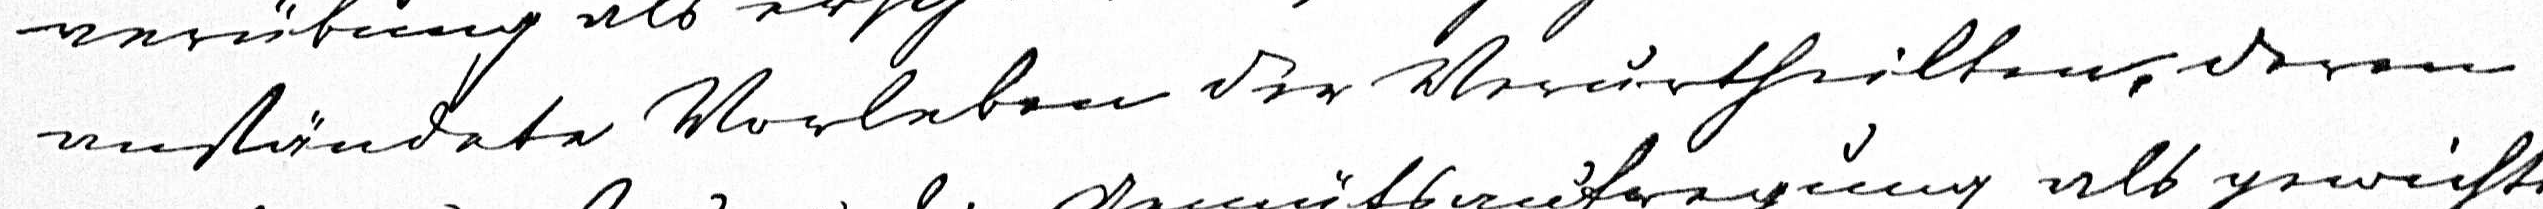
anständete Vorleben der Verurtheilten, deren
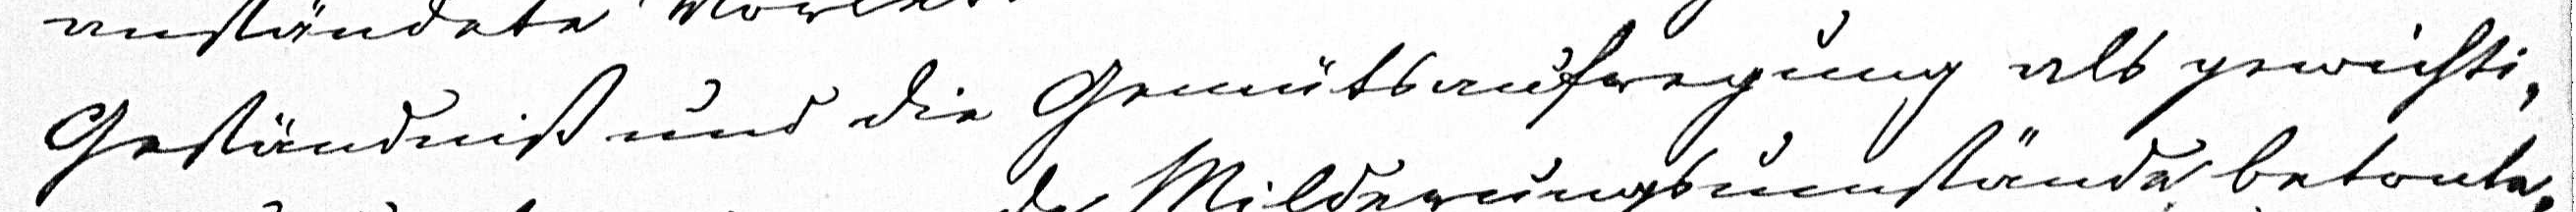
Geständniß und die Gemütsaufregung als gewichti¬
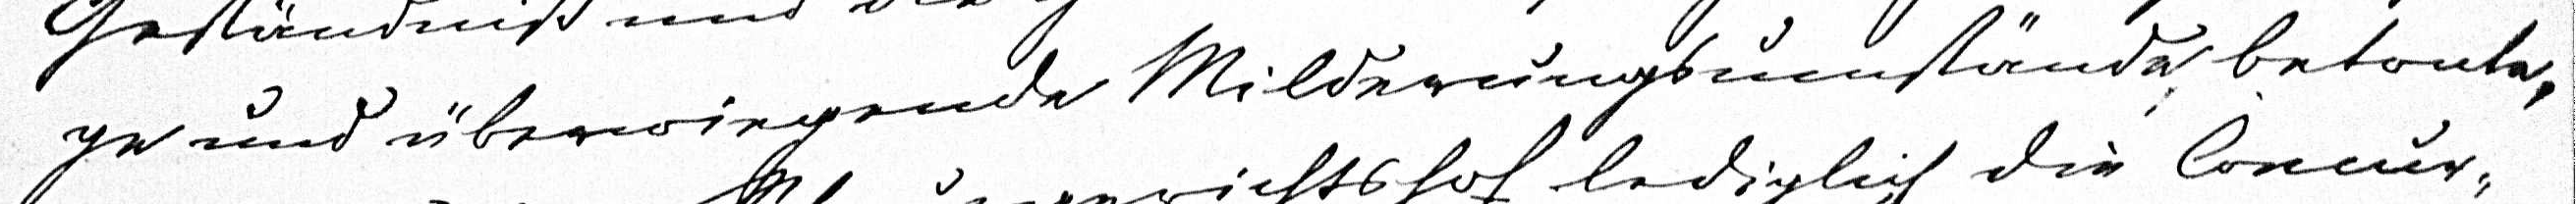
ge und überwiegende Milderungsumstände betonte,
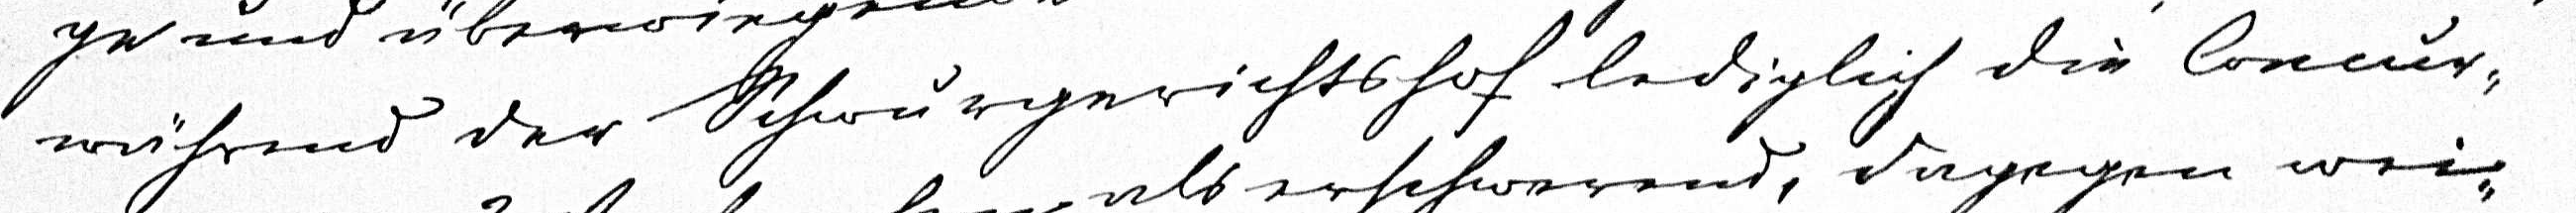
während der Schwurgerichtshof lediglich die Concur¬
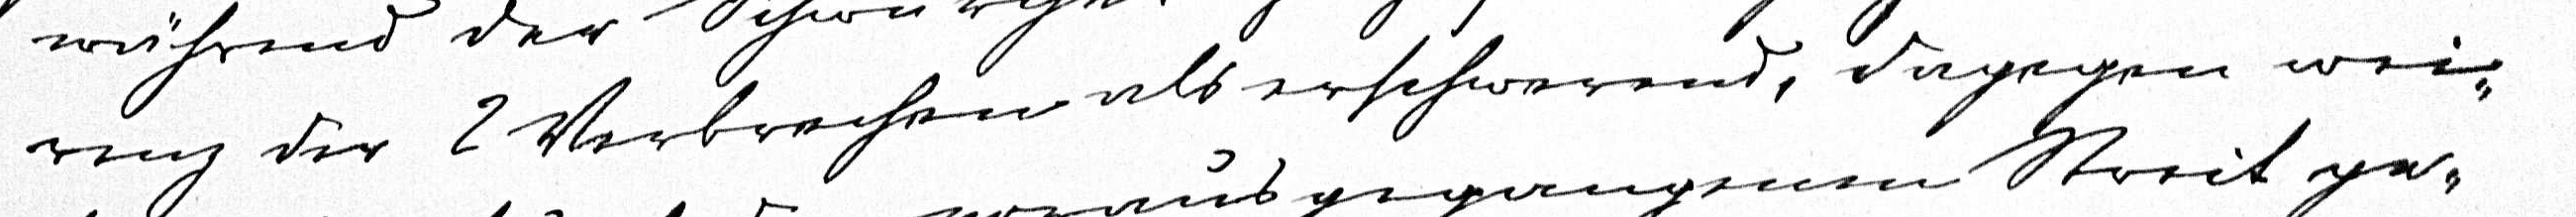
renz der 2 Verbrechen als erschwerend, dagegen wei¬
